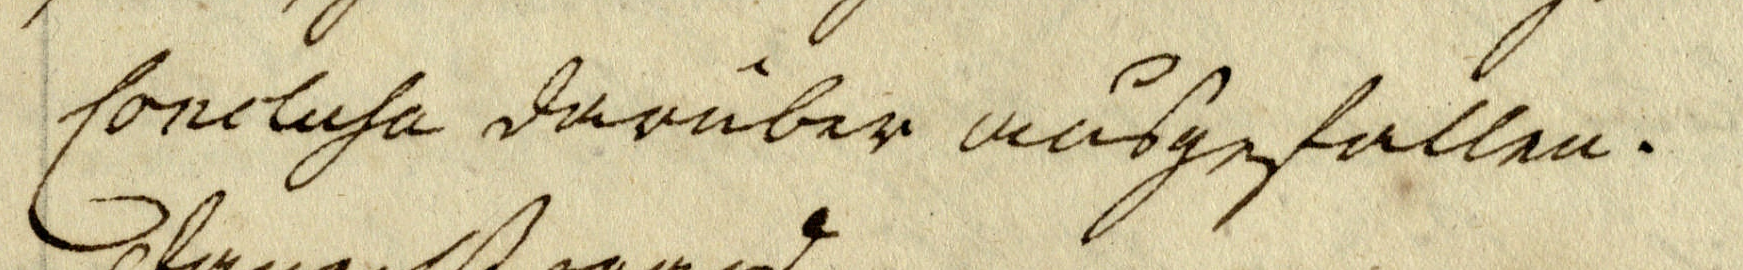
Conclusa darüber ausgefallen.
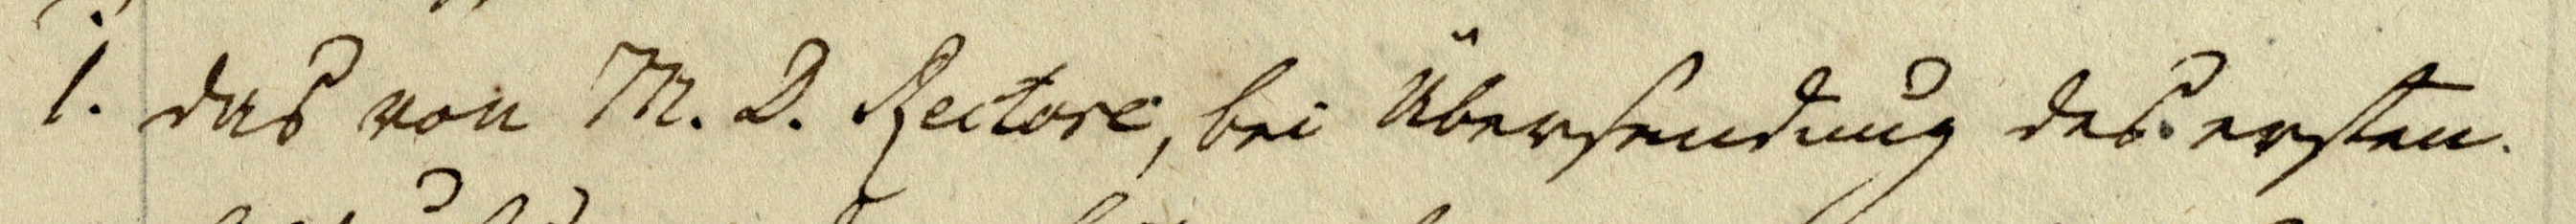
1. das von M. D. Rectore, bei Übersendung des ersten
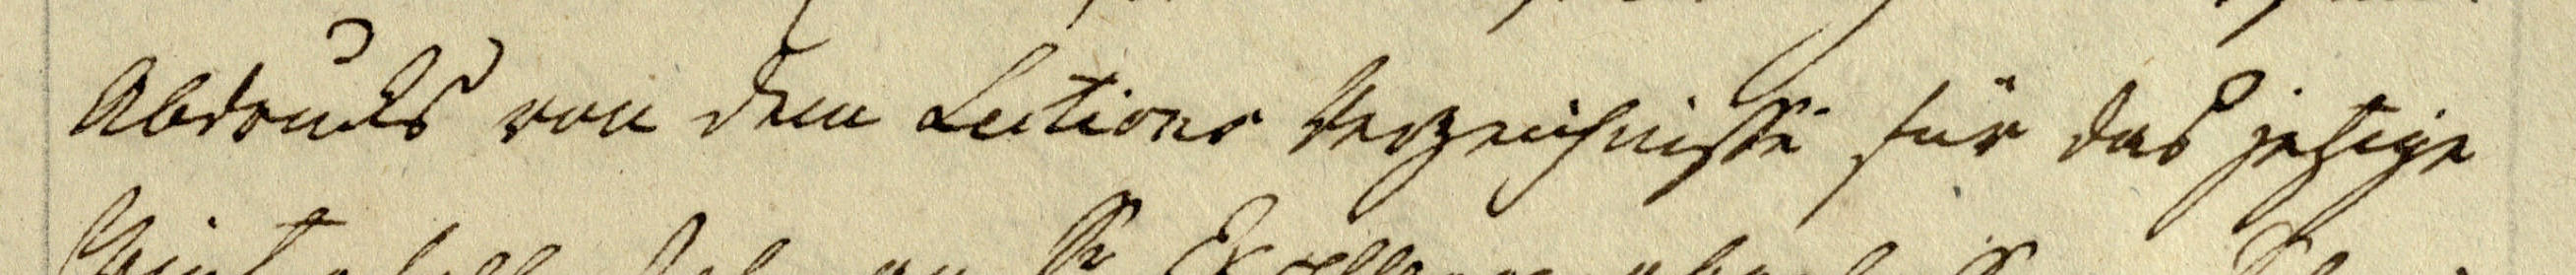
Abdrucks von dem Lections Verzeichnisse für das jetzige
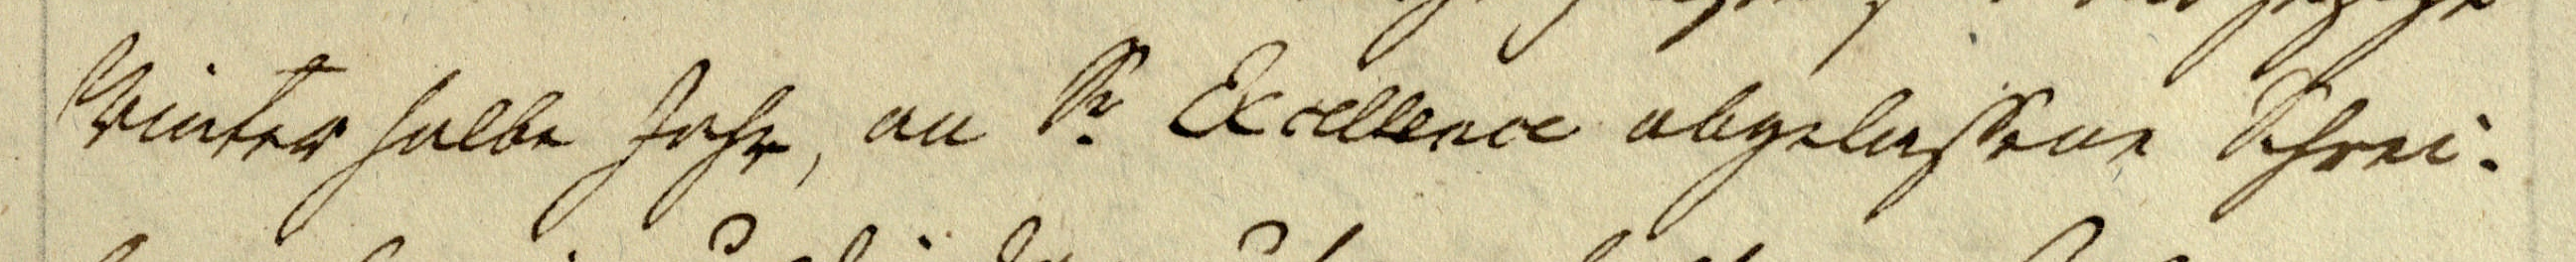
Winter halbe Jahr, an Sr Excellence abgelassene Schrei¬
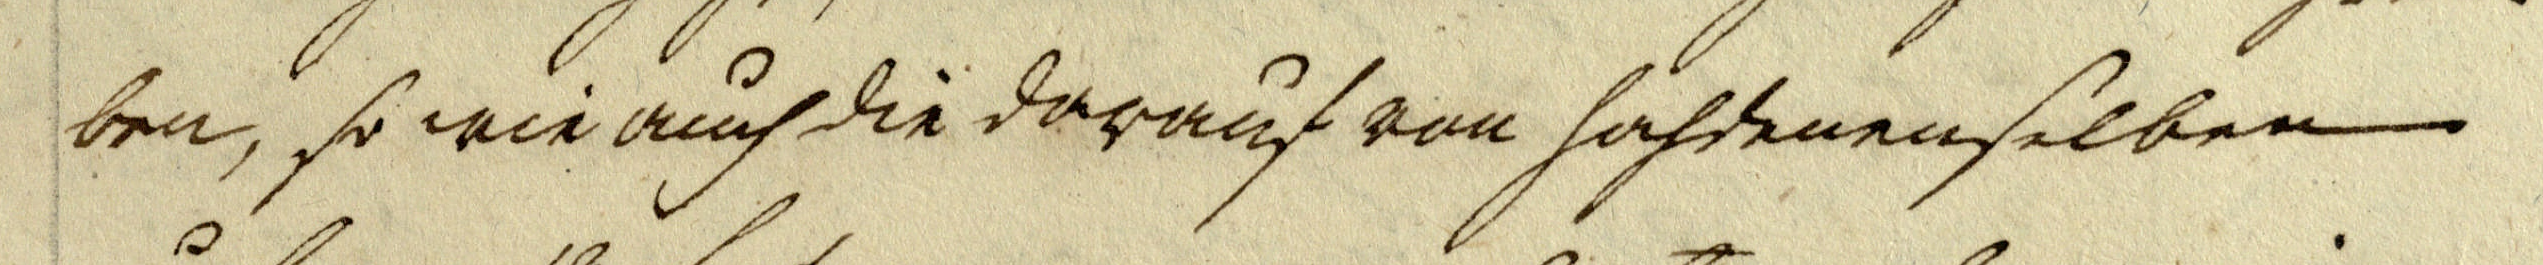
ben, so wie auch die darauf von hochdenenselben
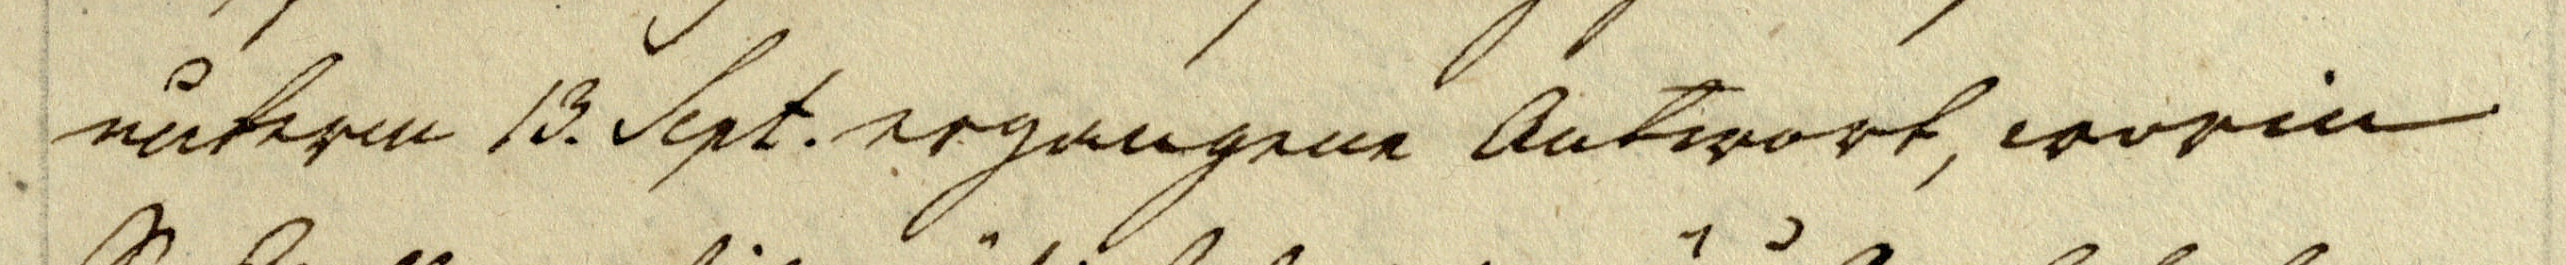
unterm 13. Sept. ergangene Antwort, worin
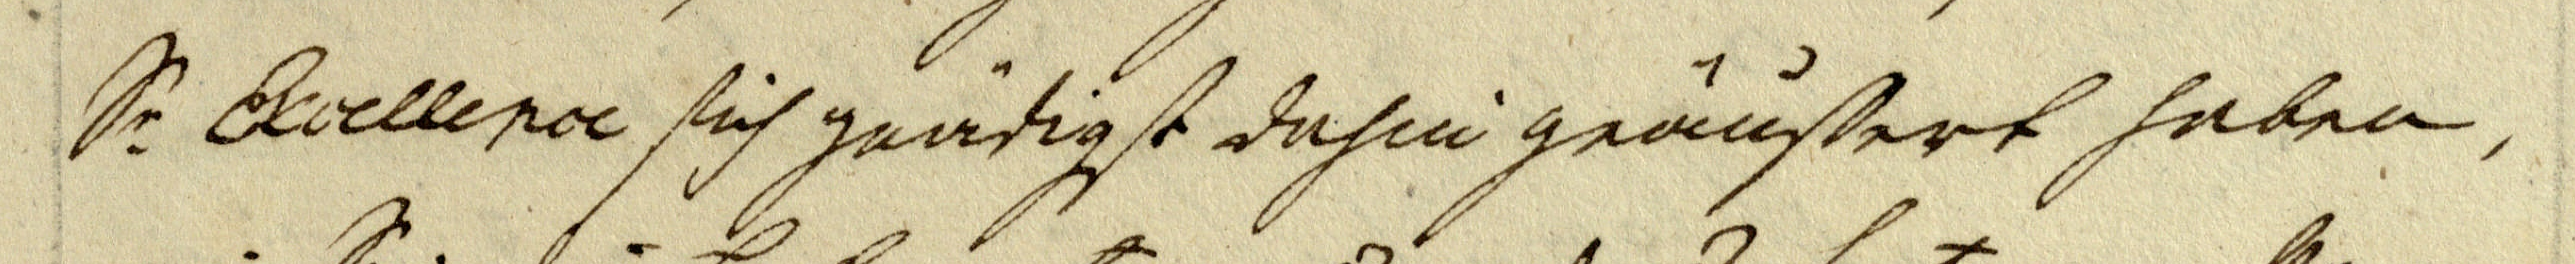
Sr Excellence sich gnädigst dahin geäussert haben,
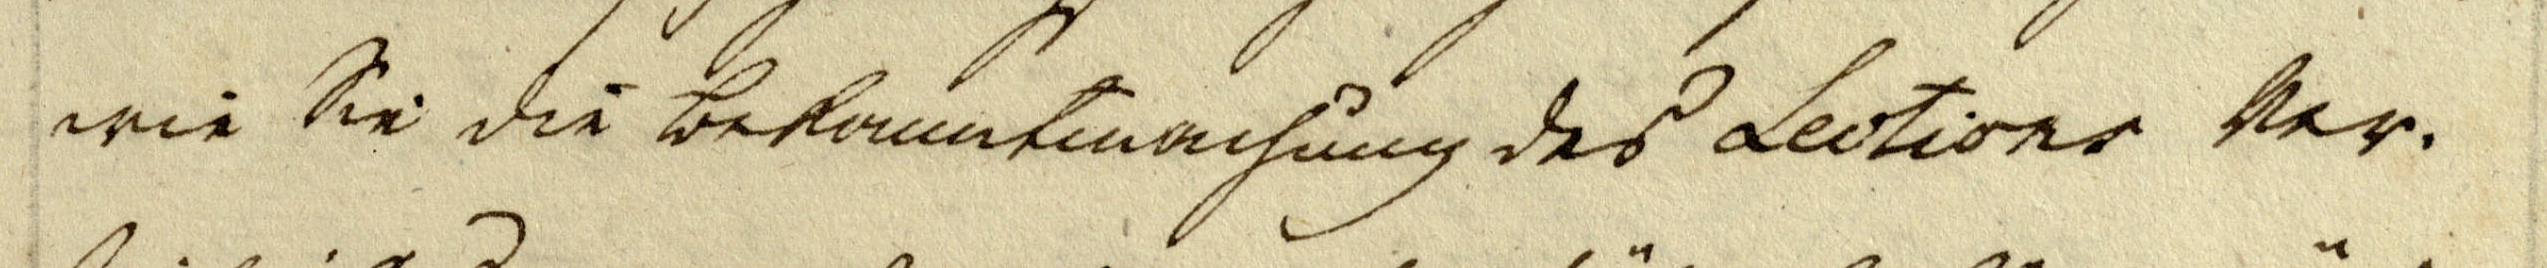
wie Sie die Bekanntmachung des Lections Ver¬
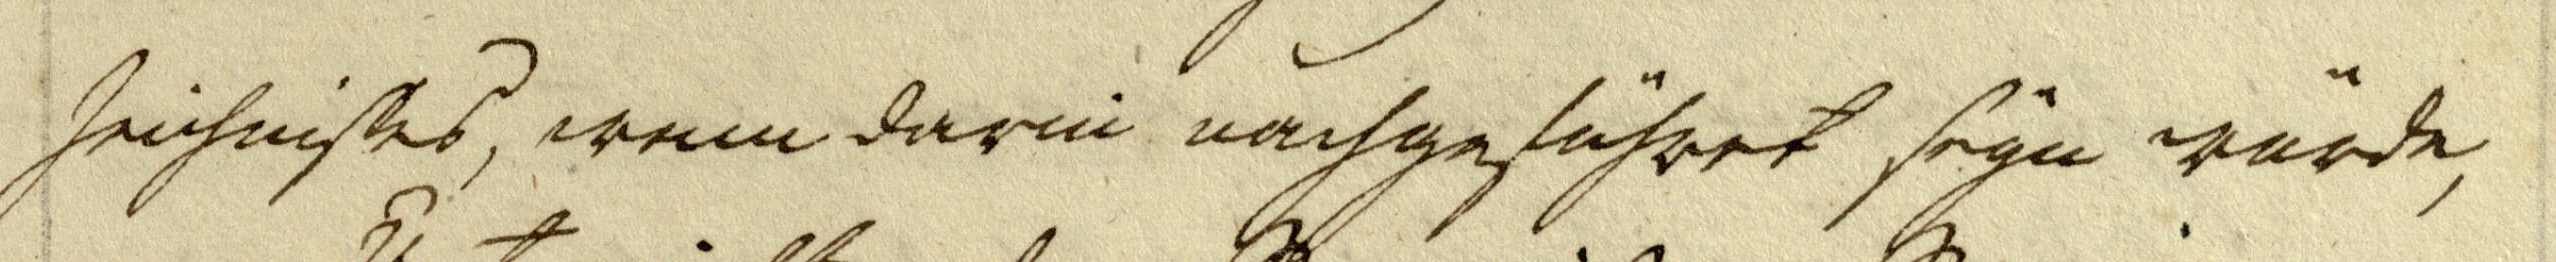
zeichnisses, wenn darin nachgeführet seÿn würde,
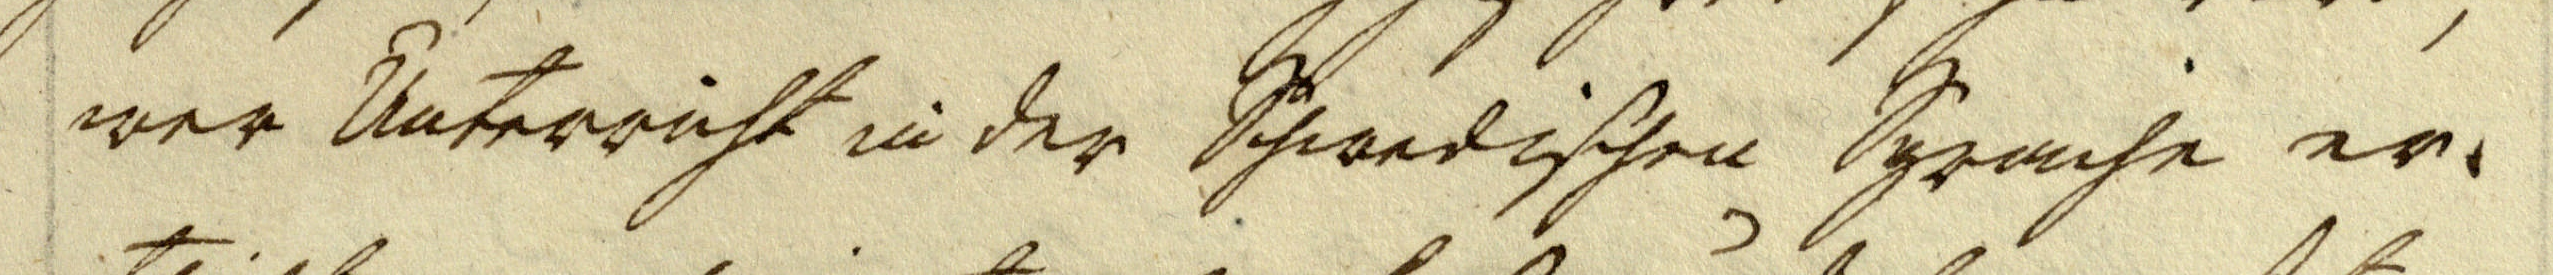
wer Unterricht in der Schwedischen Sprache er¬
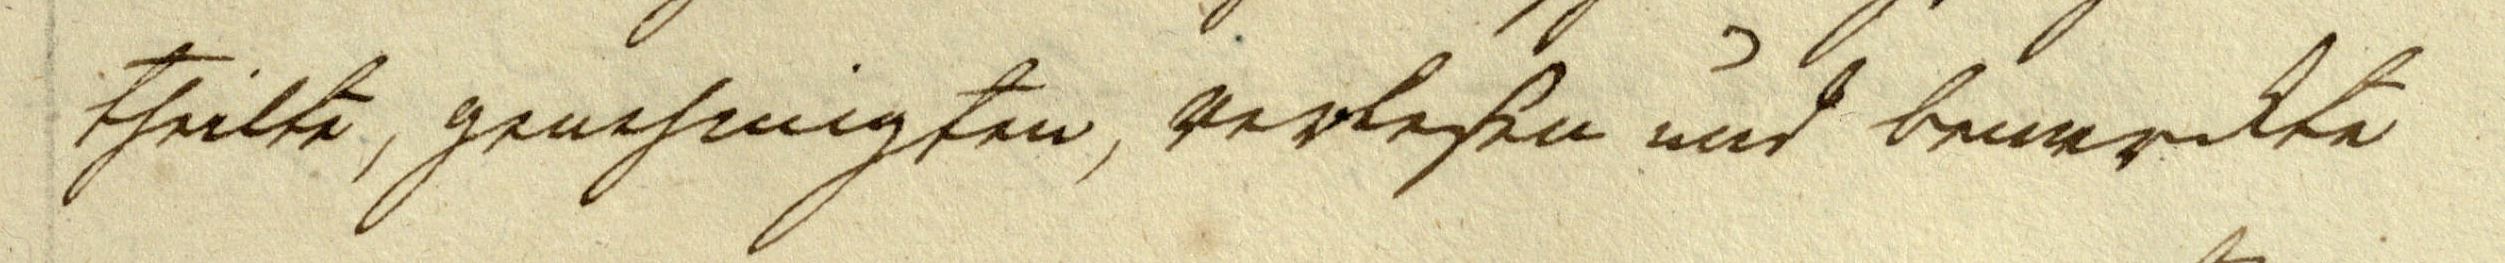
theilte, genehmigten, verlesen und bemerckte
